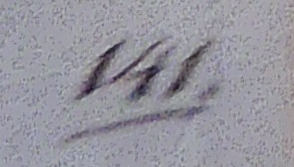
141.
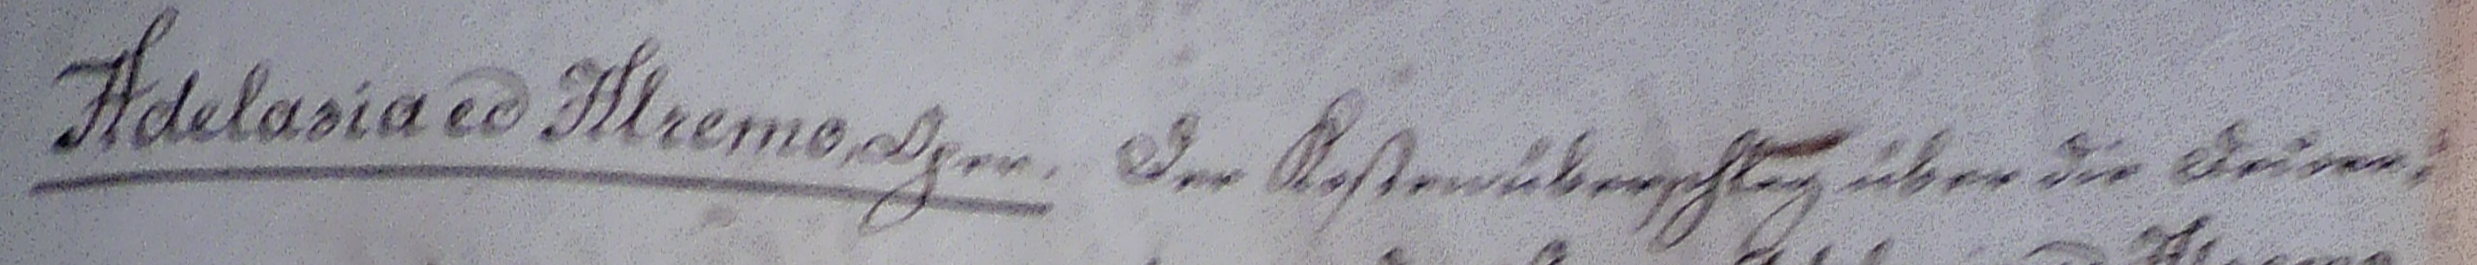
Adelasia ed Alremo, Oper. Der Kostenüberschlag über die Decora¬
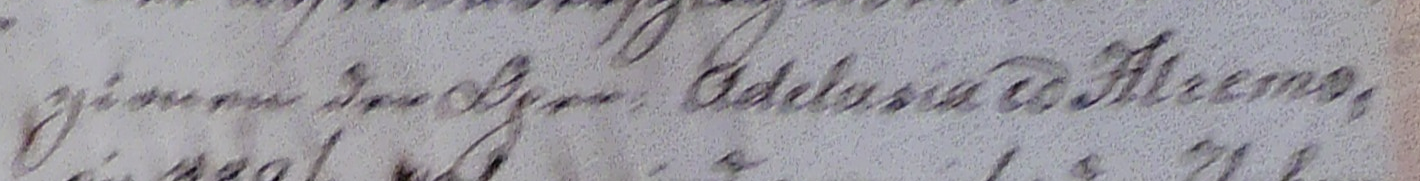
zionen der Oper: Adelasia ed Alremo,
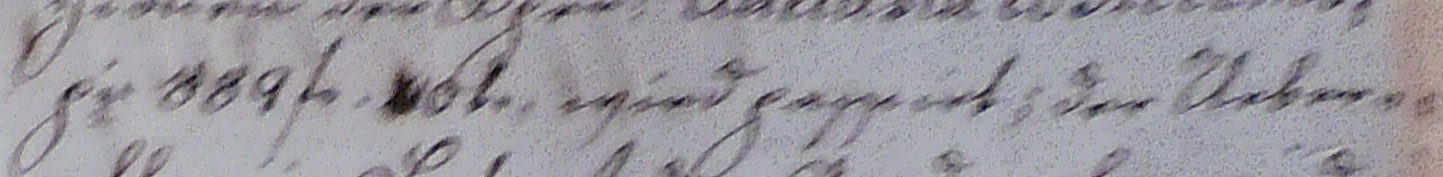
pr͇ 889fr. 40kr. wird passirt; der Ueber
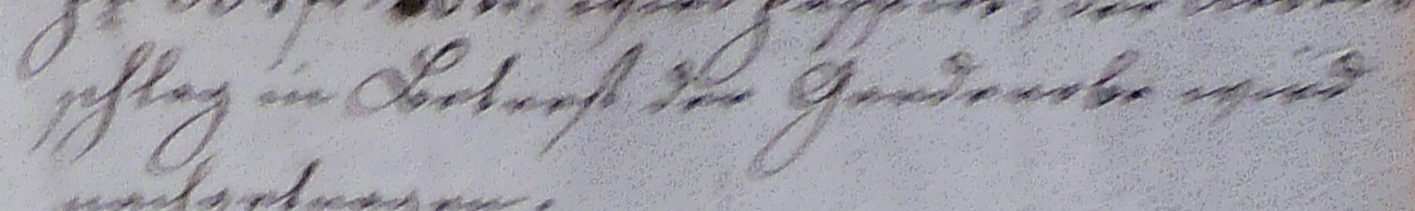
schlag in Betref der Garderobe wird
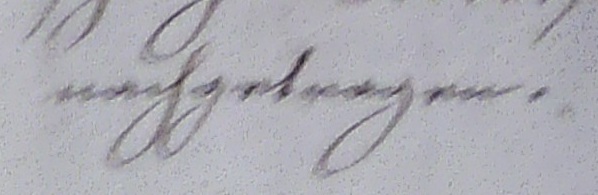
nachgetragen.
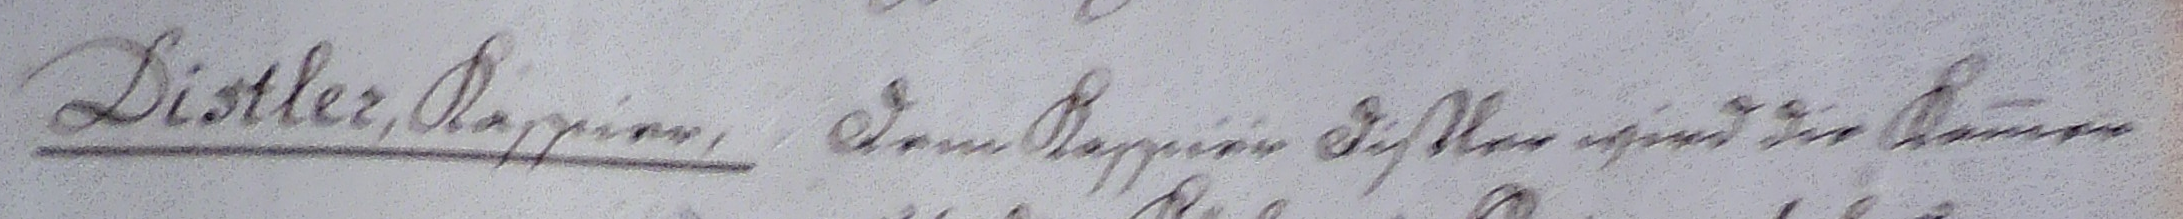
Distler, Kassier, Dem Kassier Distler wird die Kam̅er
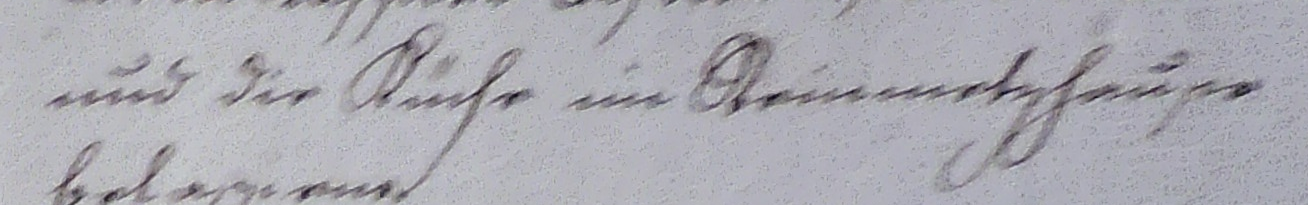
und die Küche im Steinmetzhause
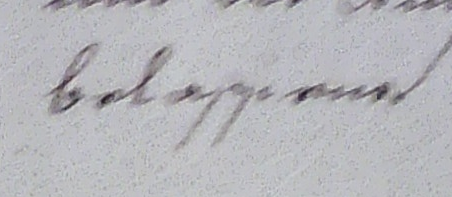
belassen.
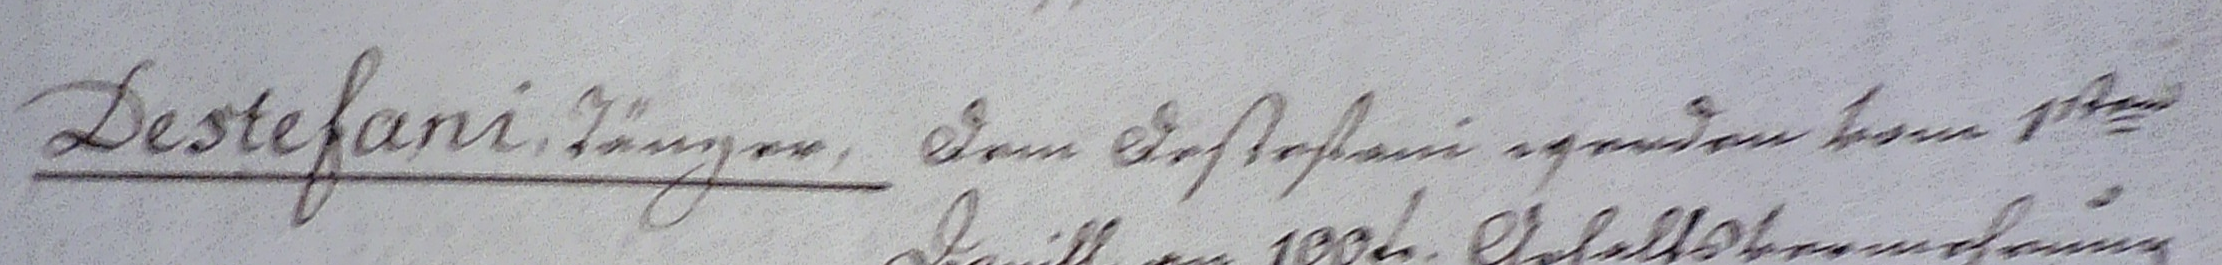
Destefani, Tänzer. Dem Destefani werden vom 1ste͇n
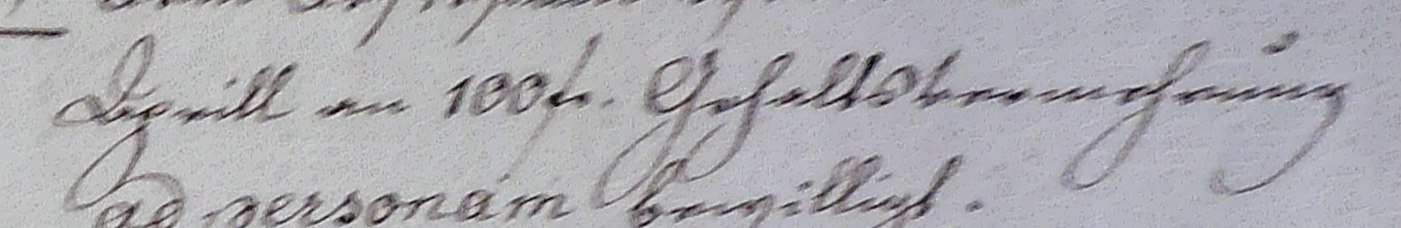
Aprill an 100fr. Gehaltsvermehrung
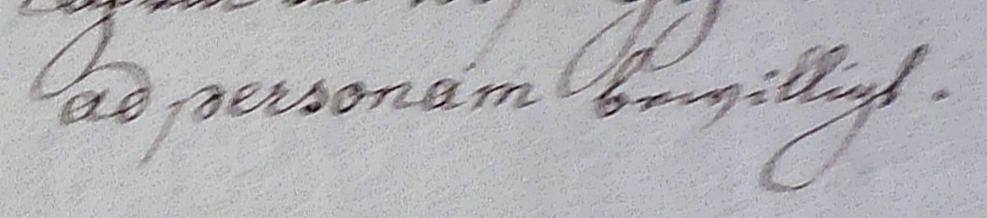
ad personam bewilligt.
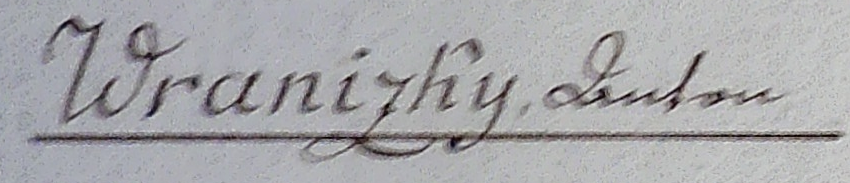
Wranizky, Anton
